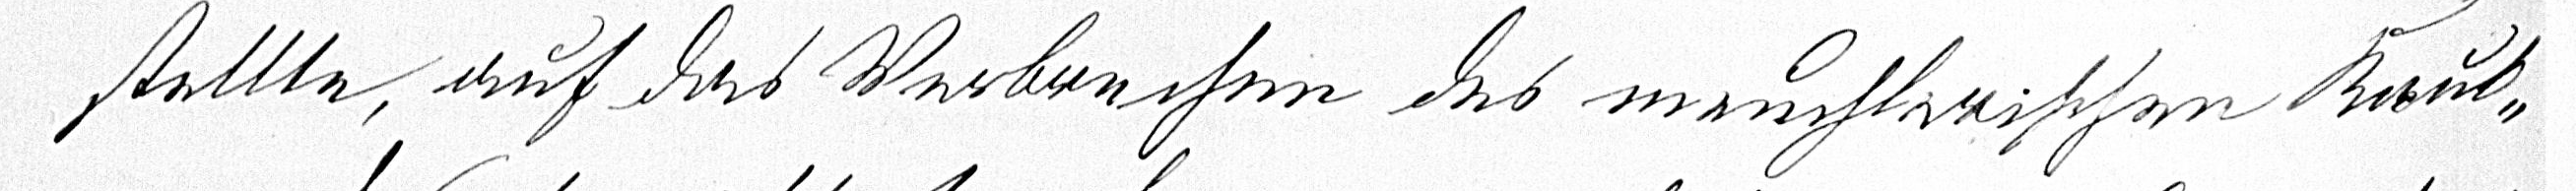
stelle, auf das Verbrechen des meuchlerischen Raub¬
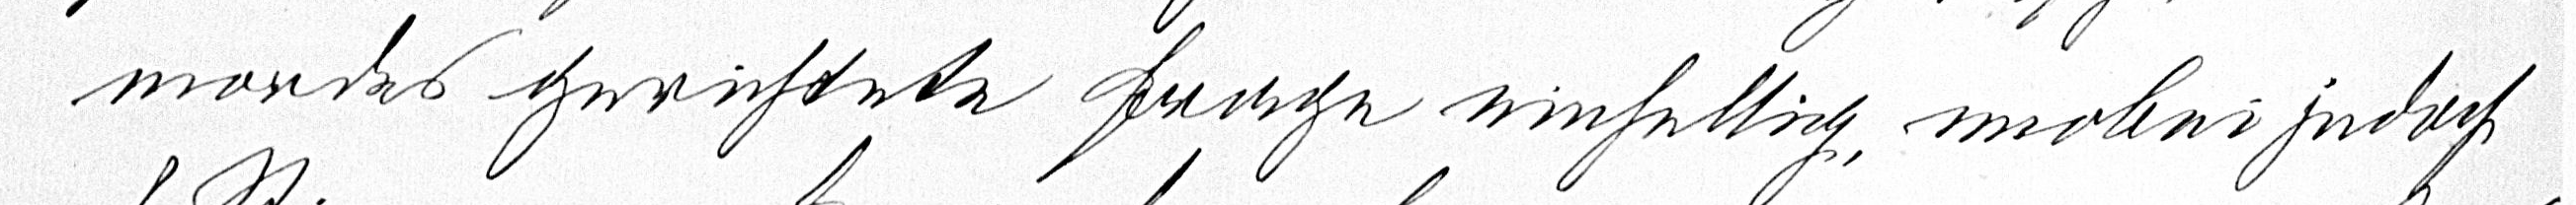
mordes gerichtete Frage einhellig, wobei jedoch
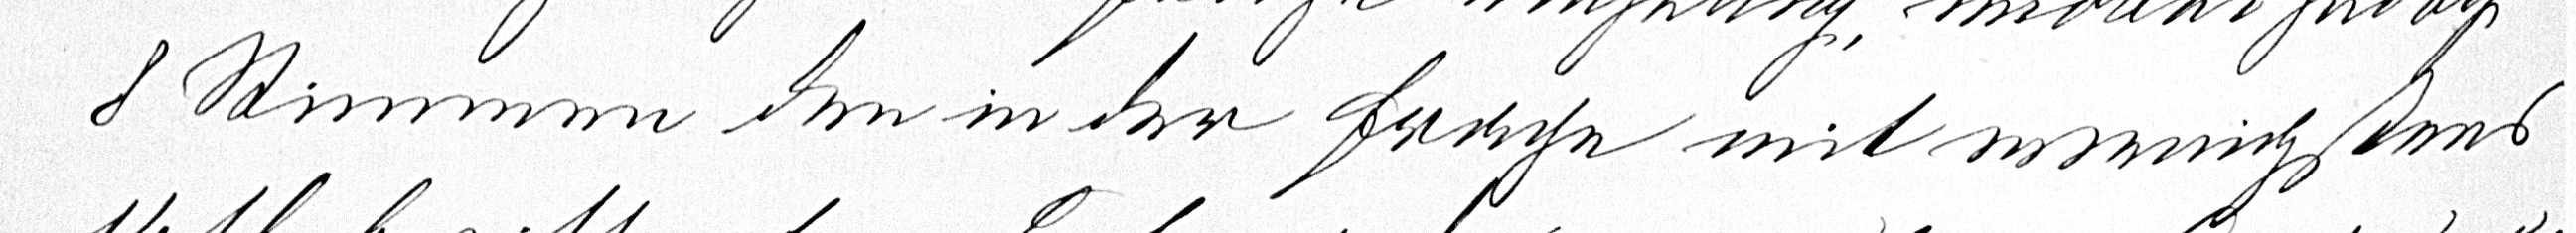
8 Stimmen den in der Frage mit wenigstens
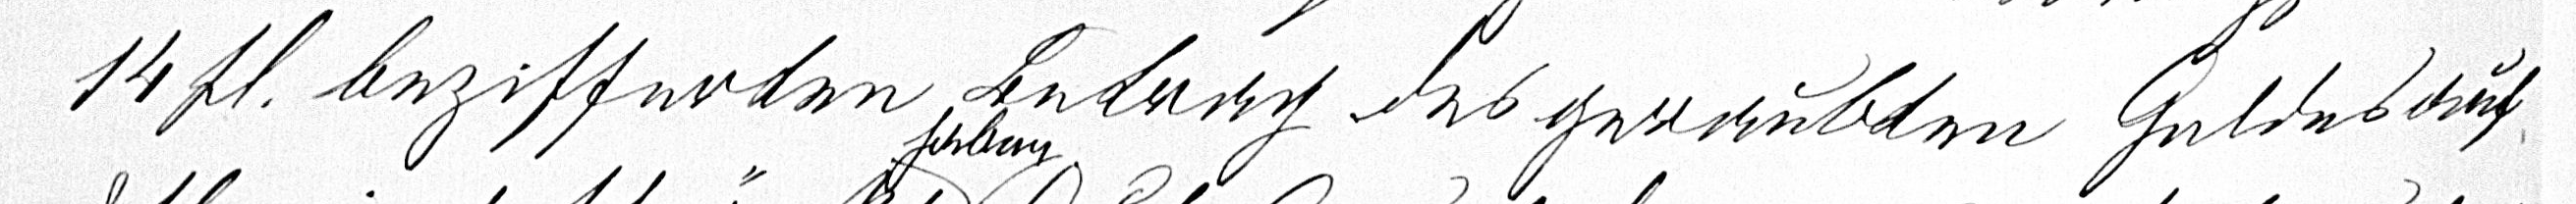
14 fl. bezifferten Betrag des geraubten Geldes auf
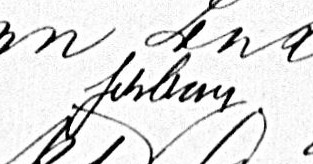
haben
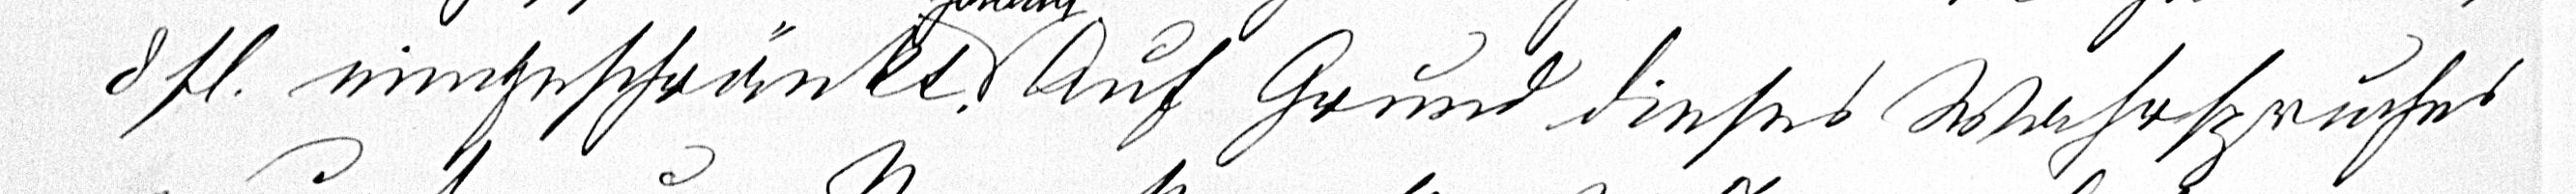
8 fl. eingeschränkt. Auf Grund dieses Wahrspruches
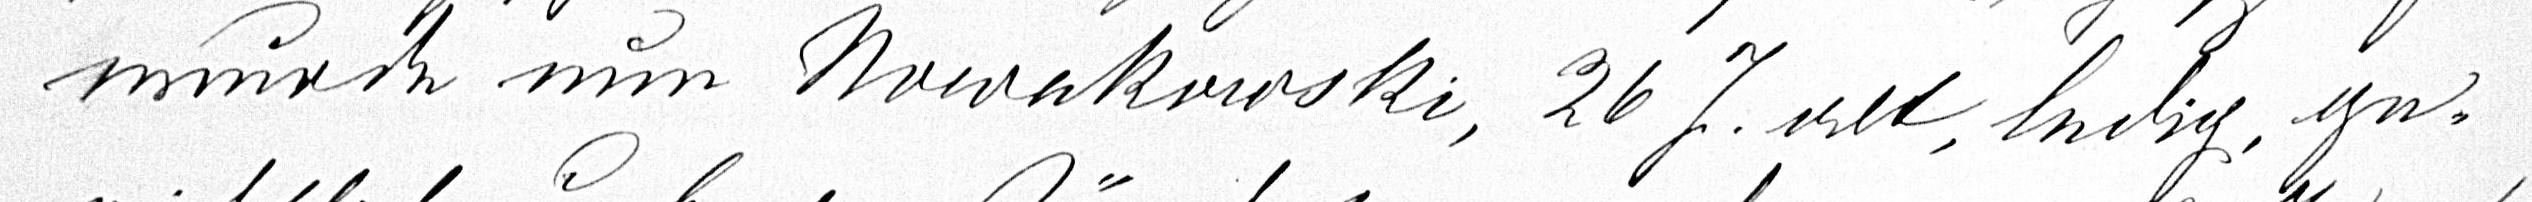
wurde nun Nowakowski, 26 J. alt, ledig, ge¬
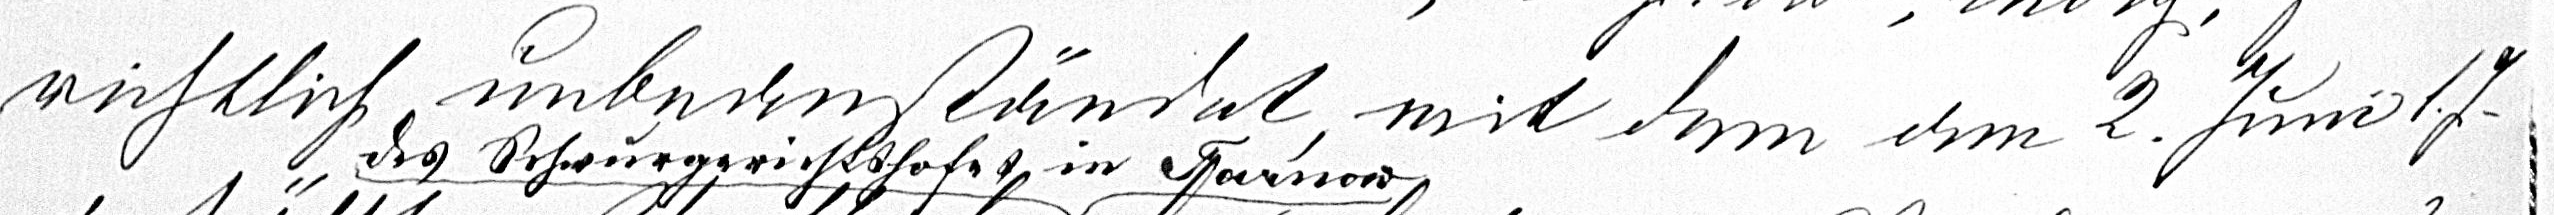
richtlich unbeanständet, mit dem am 2. Juni l. Jß
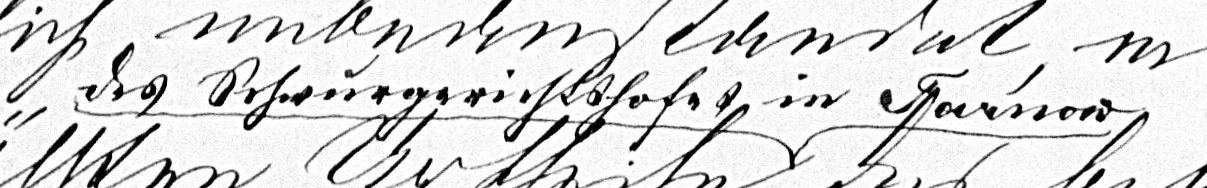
des Schwurgerichtshofes in Tarow
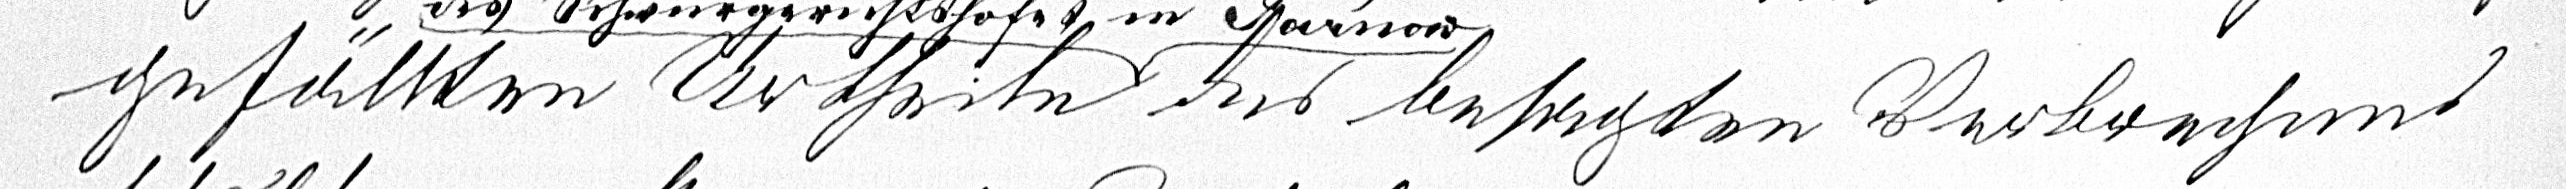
gefällten Urtheilte des besagten Verbrechend
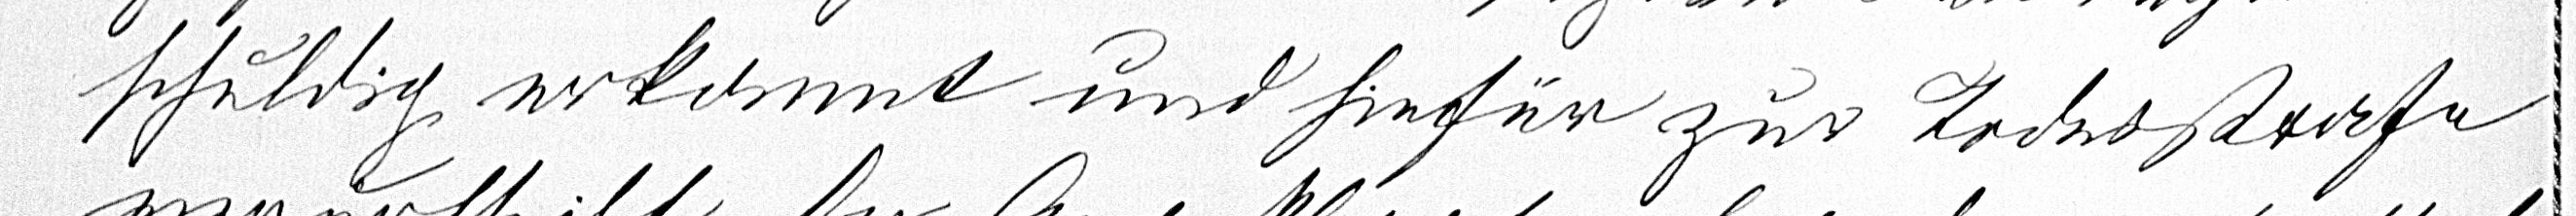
schuldig erkannt und hiefür zur Todesstrafe
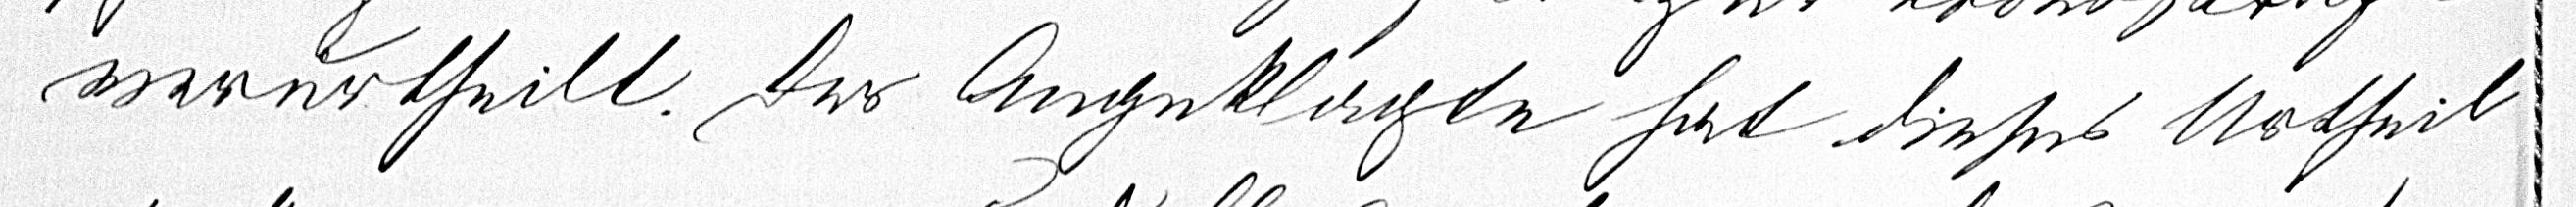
verurtheilt. Der Angeklagte hat dieses Urtheil
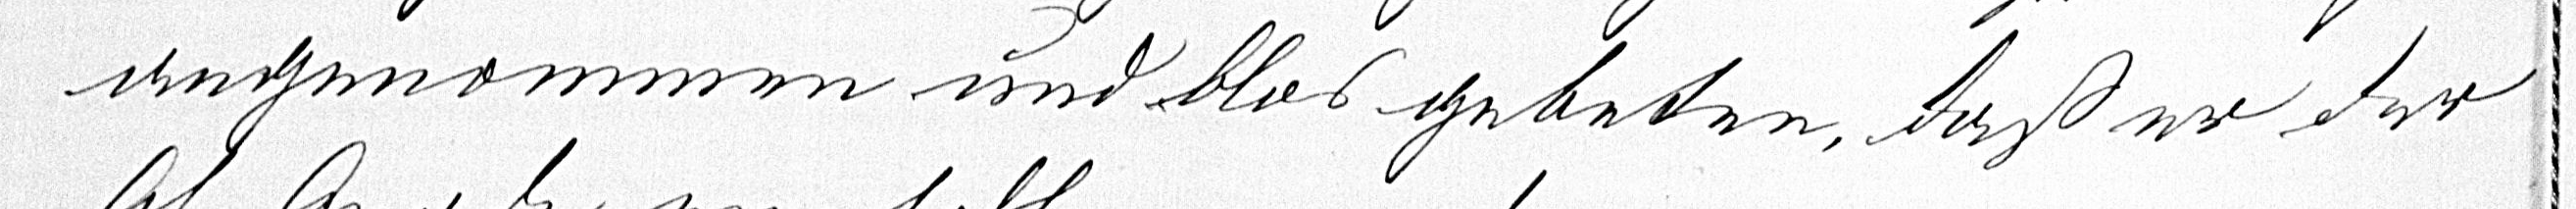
angenommen und blos gebeten, daß er der
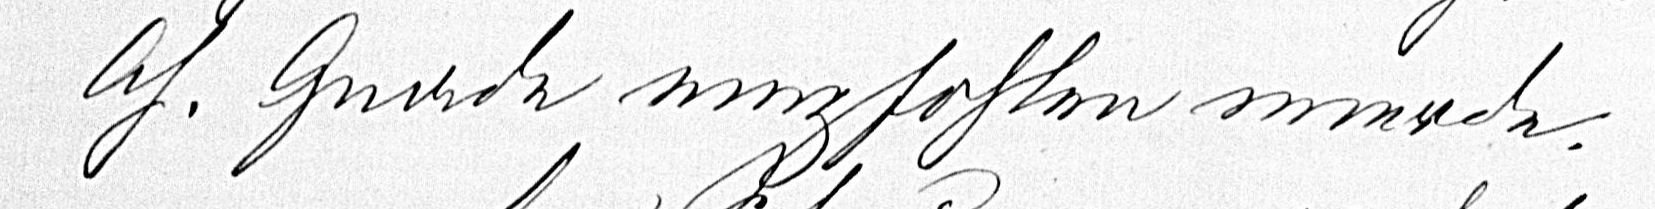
Ah. Gnade empfohlen werde.
